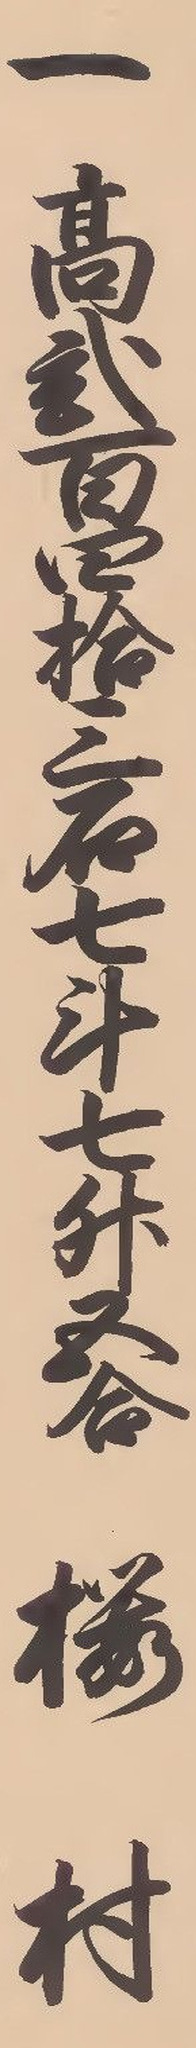一高弐百四拾三石七斗七升五合桜村
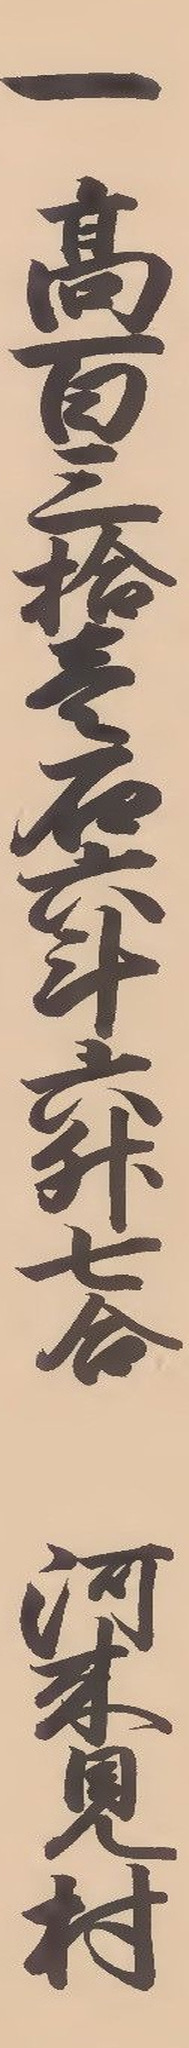一高百三拾壱石六斗六升七合河来見村
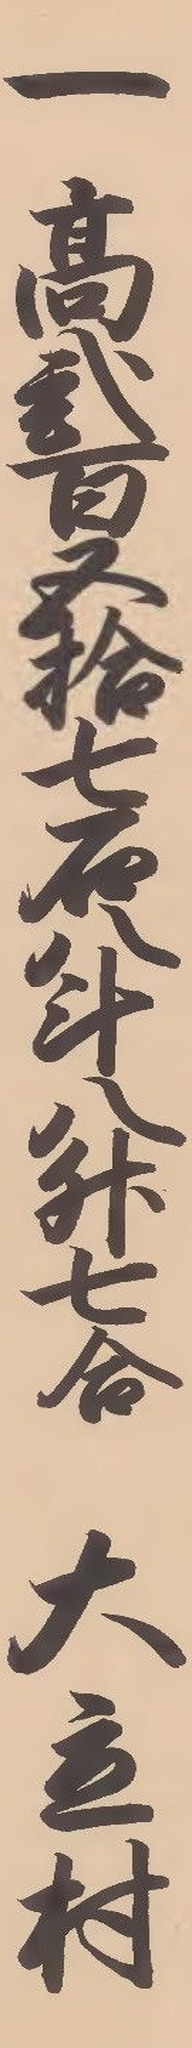一高弐百五拾七石八斗八升七合大立村
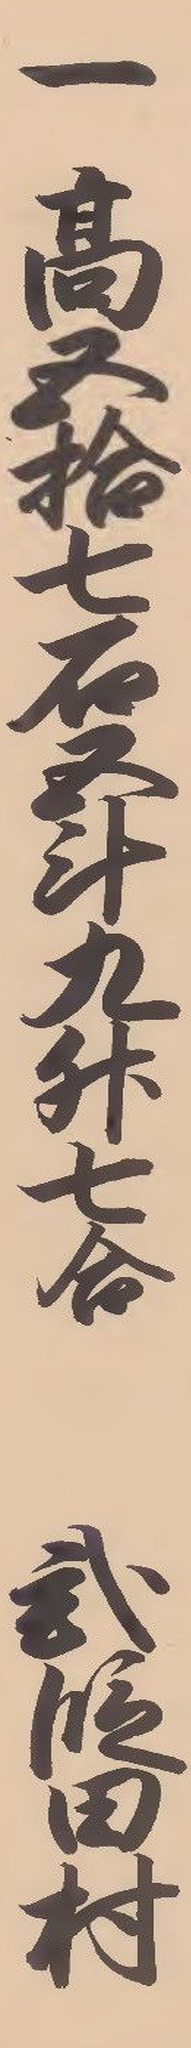一高五拾七石五斗九升七合弐段田村

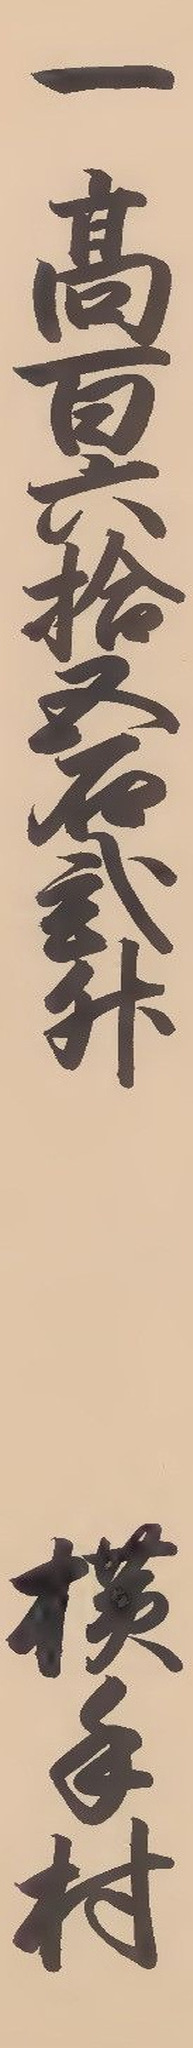一高百六拾五石弐升横手村
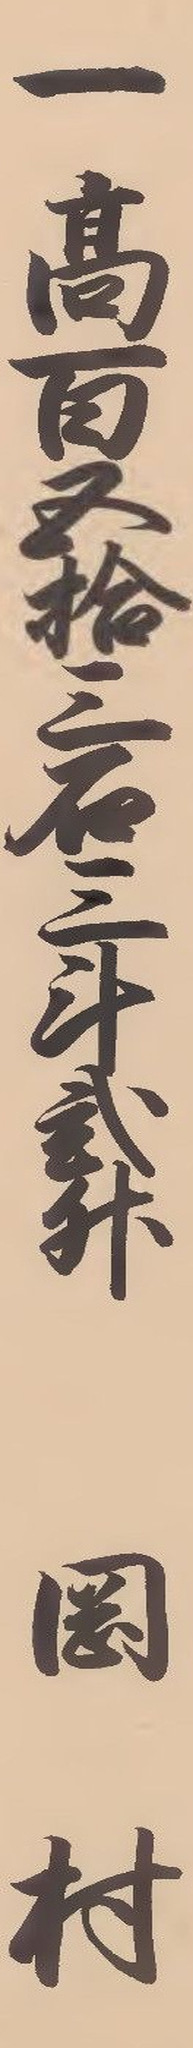一高百五拾三石三斗弐升岡村
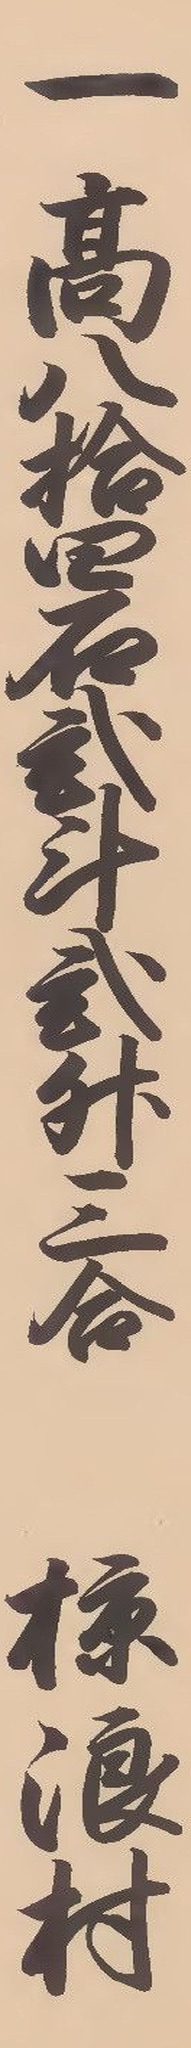一高八拾四石弐斗弐升三合椋浪村
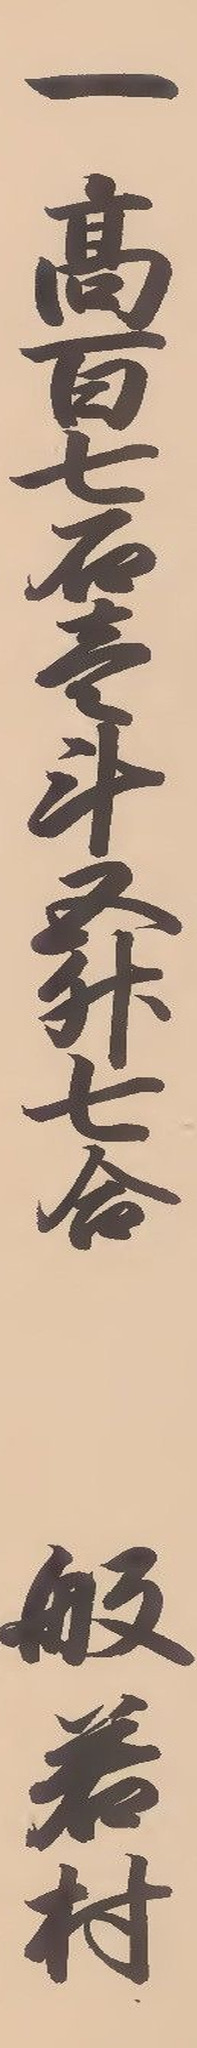一高百七石壱斗五升七合般若村
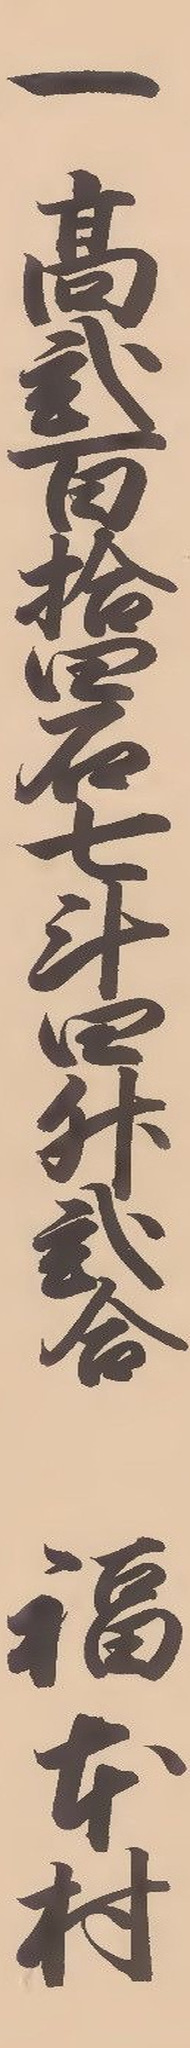一高弐百拾四石七斗四升弐合福本村
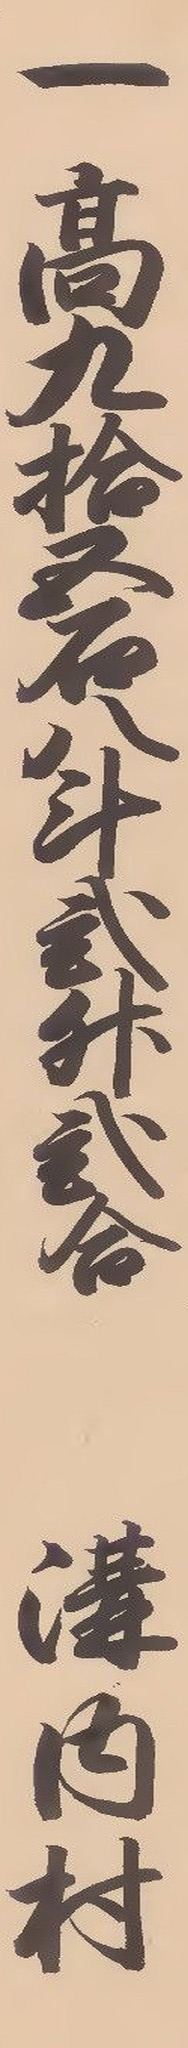一高九拾五石八斗弐升弐合溝内村

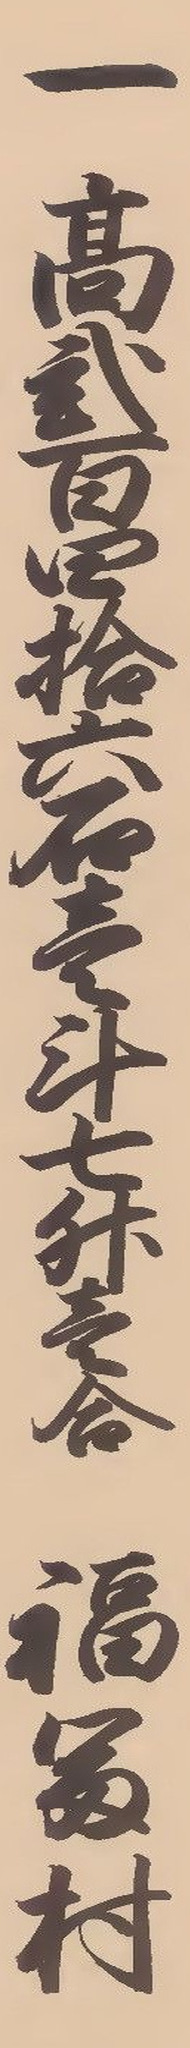一高弐百四拾六石壱斗七升壱合福富村
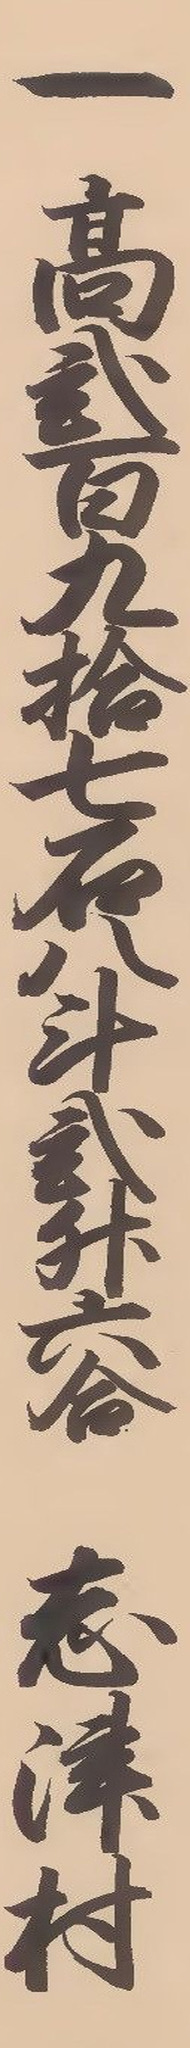一高弐百九拾七石八斗弐升六合志津村
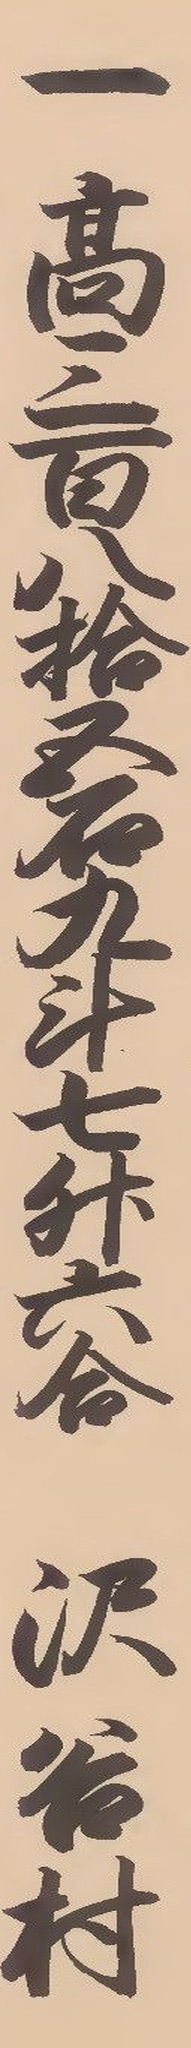一高三百八拾五石九斗七升六合沢谷村
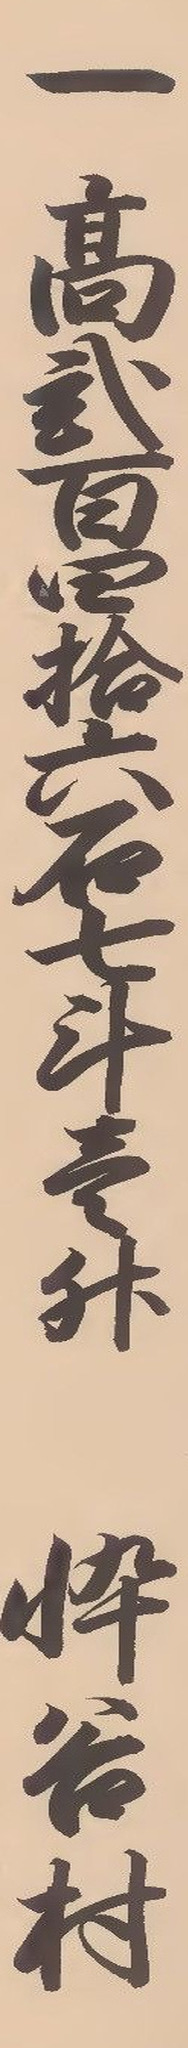一高弐百四拾六石七斗壱升忰谷村
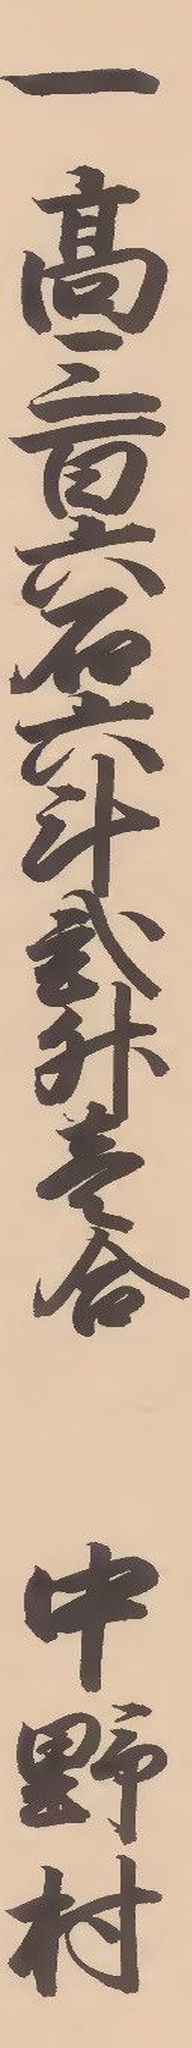一高三百六石六斗弐升壱合中野村
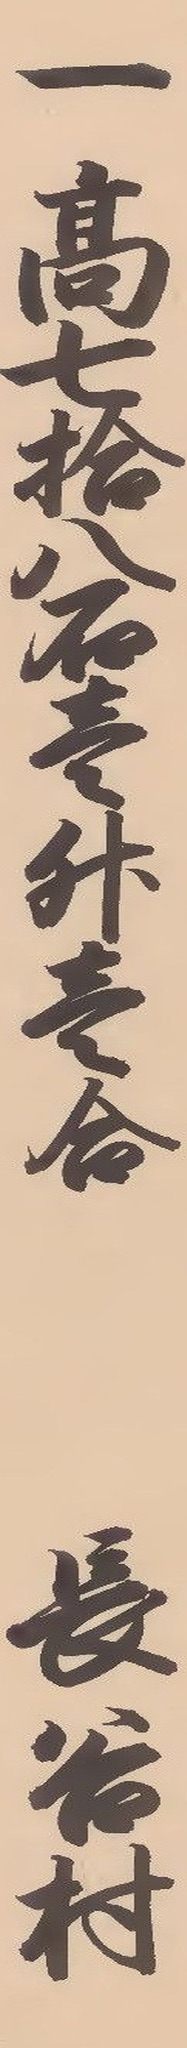一高七拾八石壱升壱合長谷村
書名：伯耆国郷帳
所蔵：国立公文書館 National Archives of Japan
